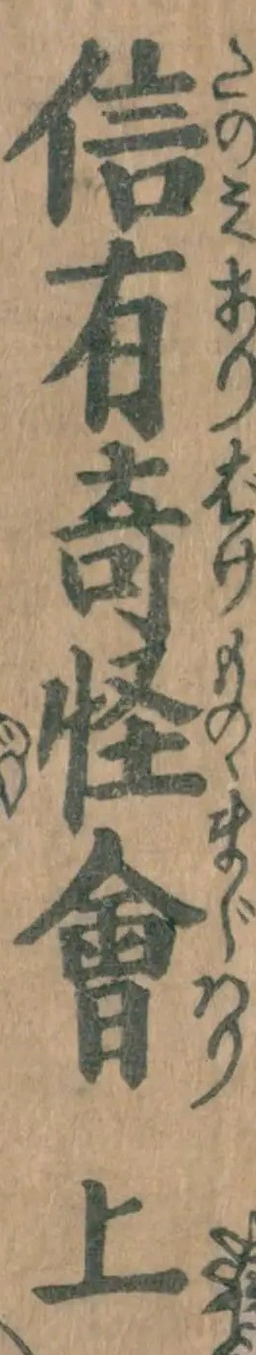信有奇怪会上

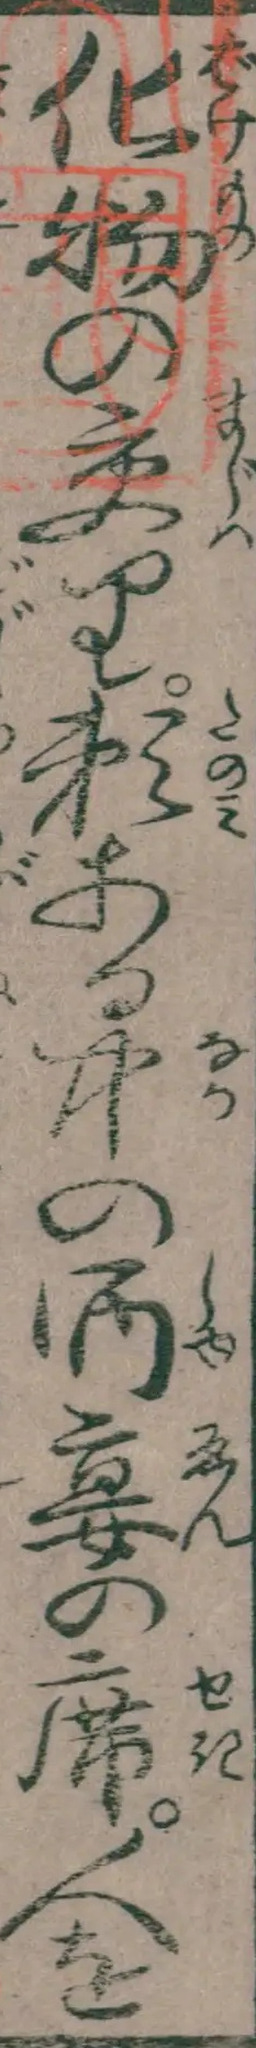化物の交り。頼ある中の酒宴の席。人を
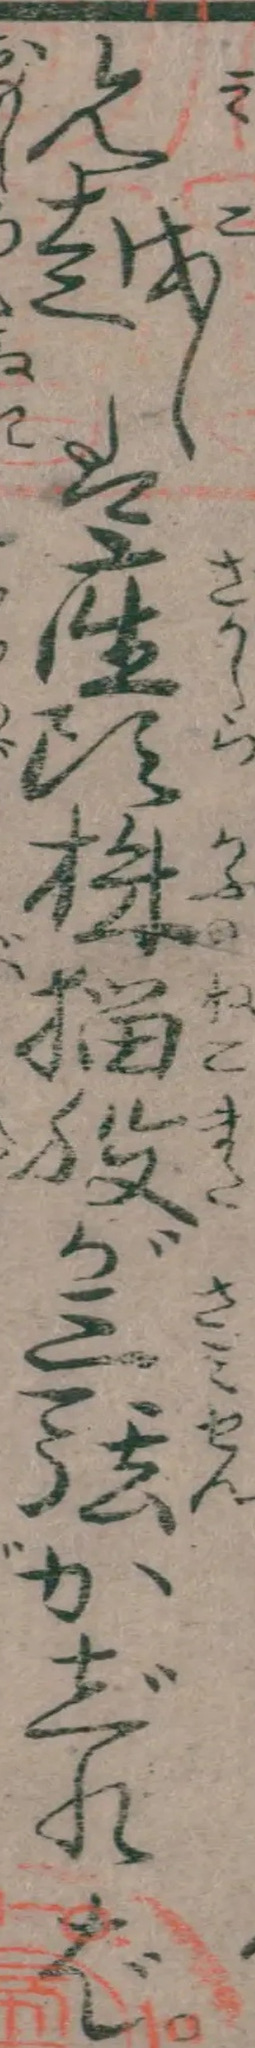見越しは座頭株。猫股が三弦かじれば。
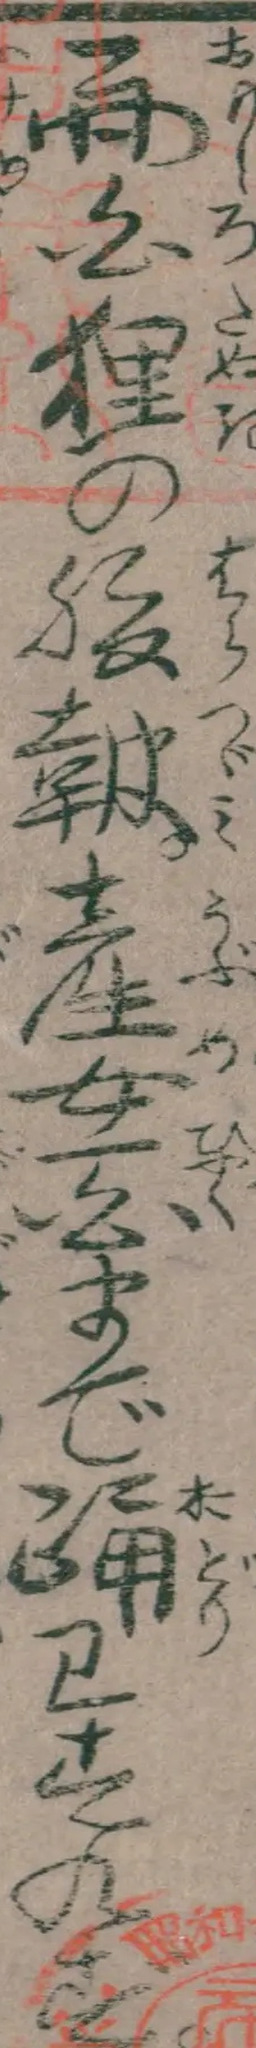面白狸の腹鼓。産女百まで踊わすれす。
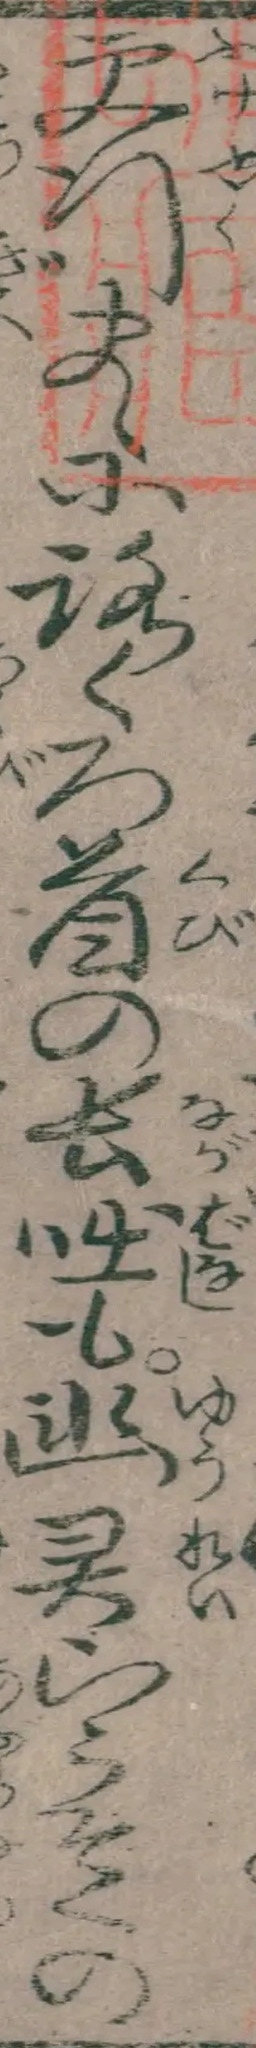更行まゝにろくろ首の長咄。幽霊らうそくの
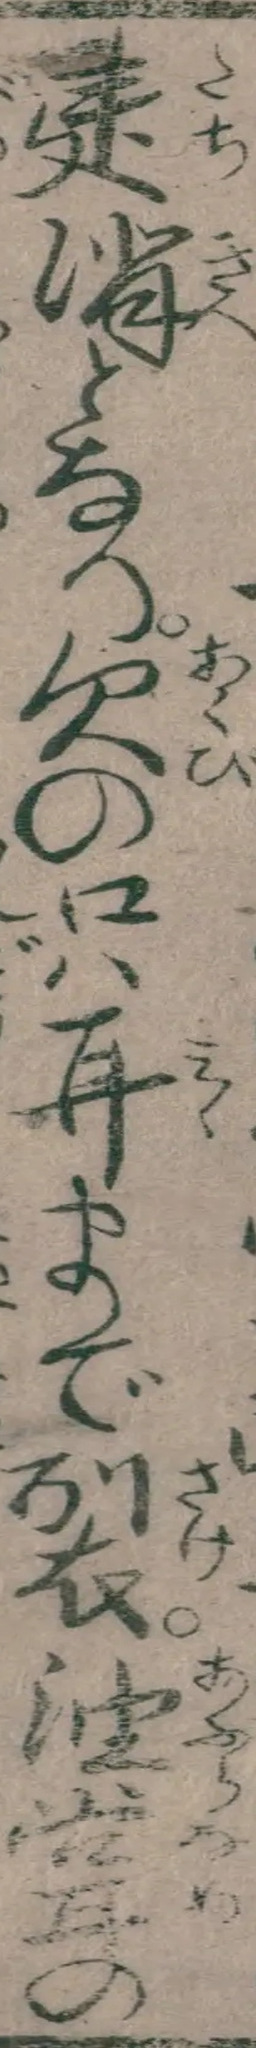建消となり。欠の口は耳まで裂。油嘗の
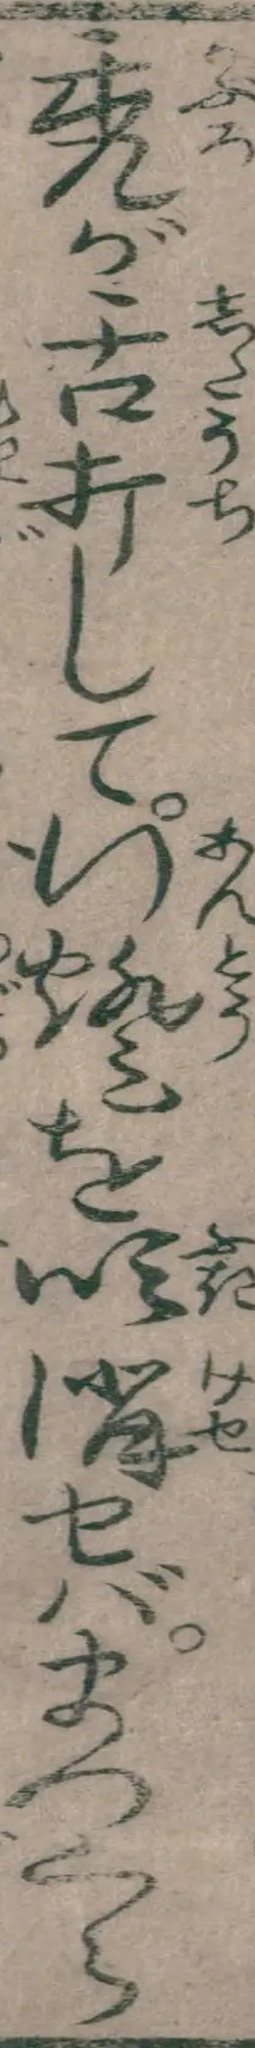禿が舌打して。行灯を吹消せば。まつくら
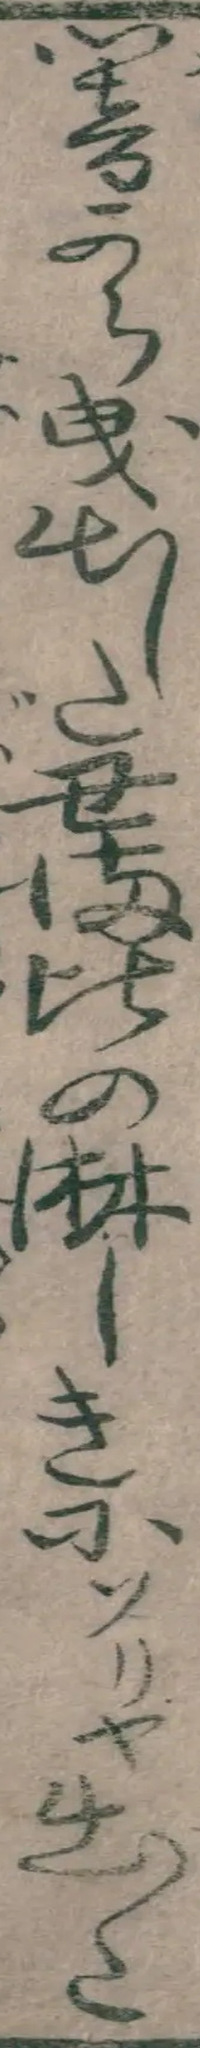闇から曳出した丑満頃の淋しきにソリヤ出た
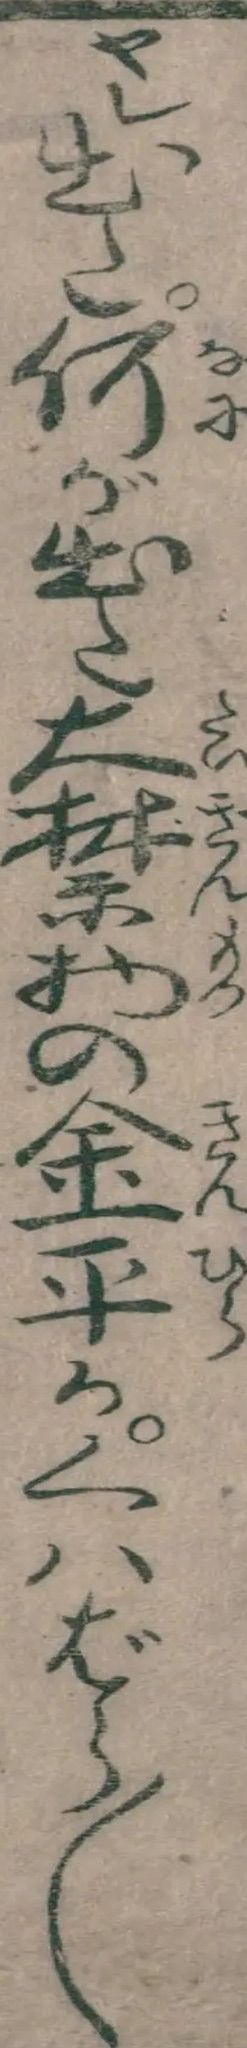ヤレ出た。何が出た大禁物の金平か。くはばら〳〵

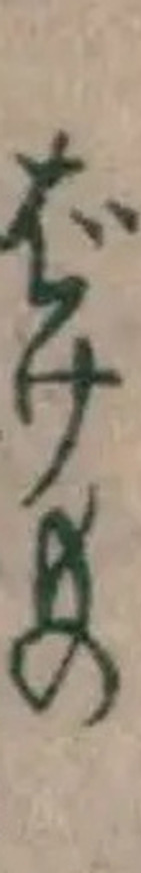ばけもの
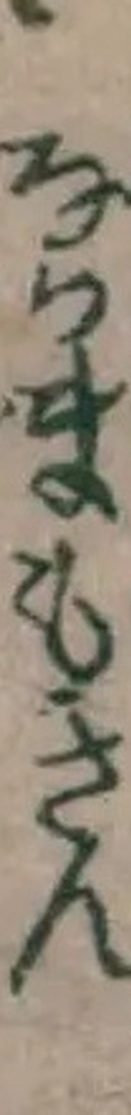なかまもきん
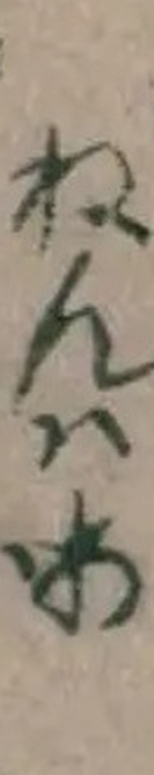ねんはあ
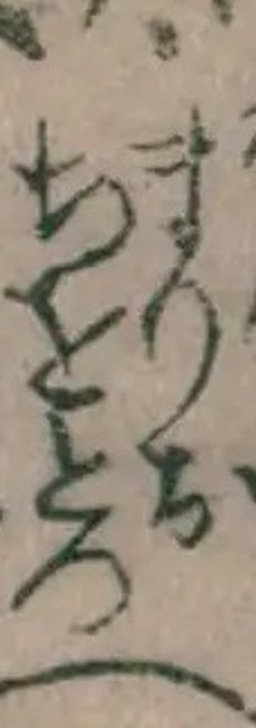ちをとつ
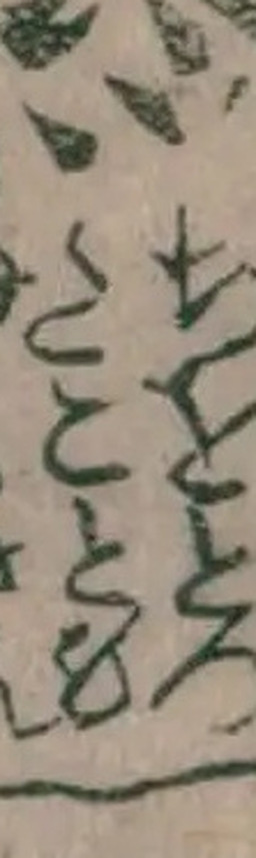たことも
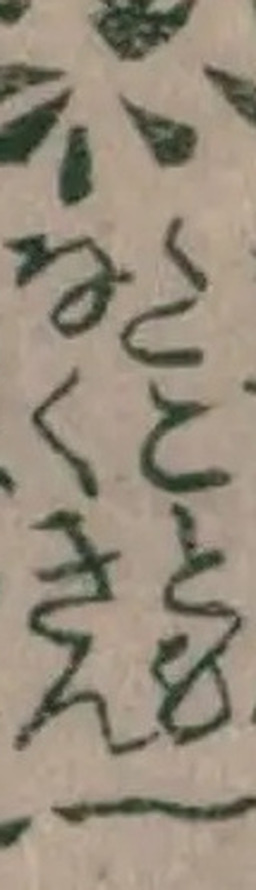なくきん
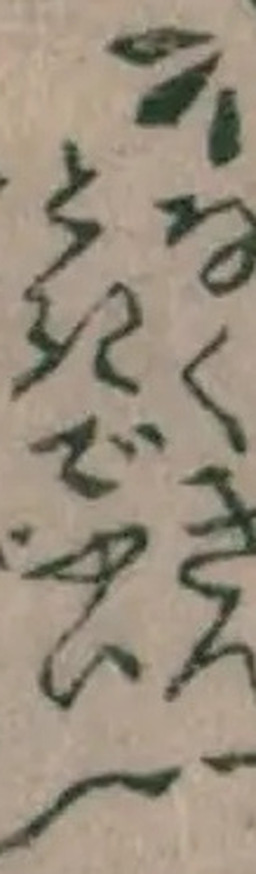ときでやい
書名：信有奇怪会
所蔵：国立国会図書館 National Diet Library, JAPAN
